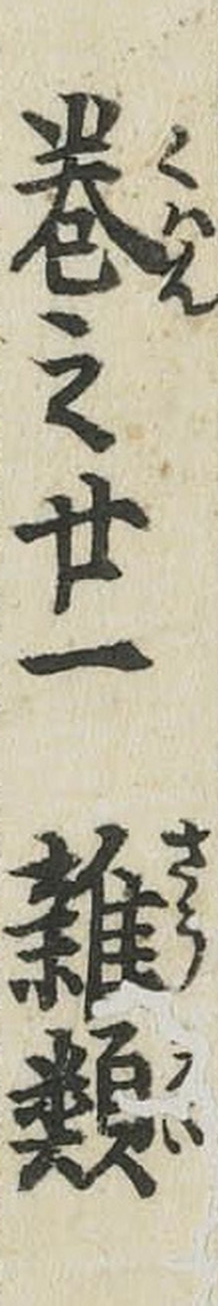巻之廿一雑類
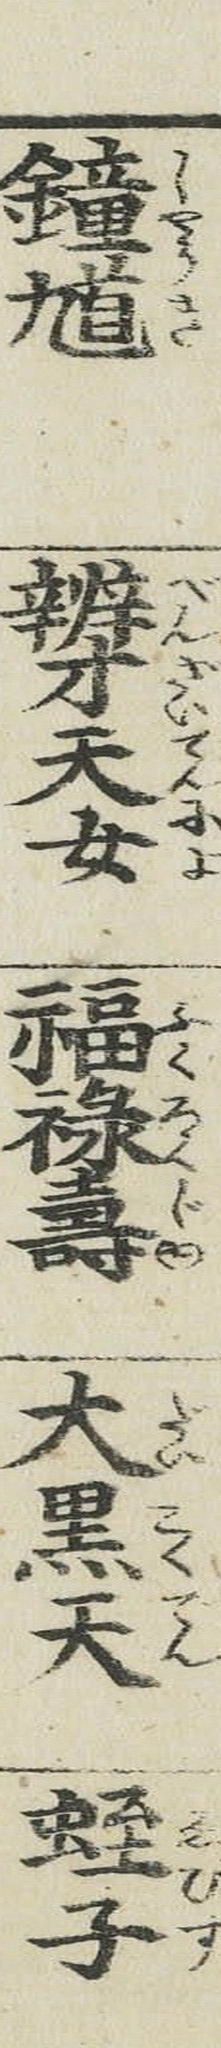鐘馗弁才天女福禄寿大黒天蛭子
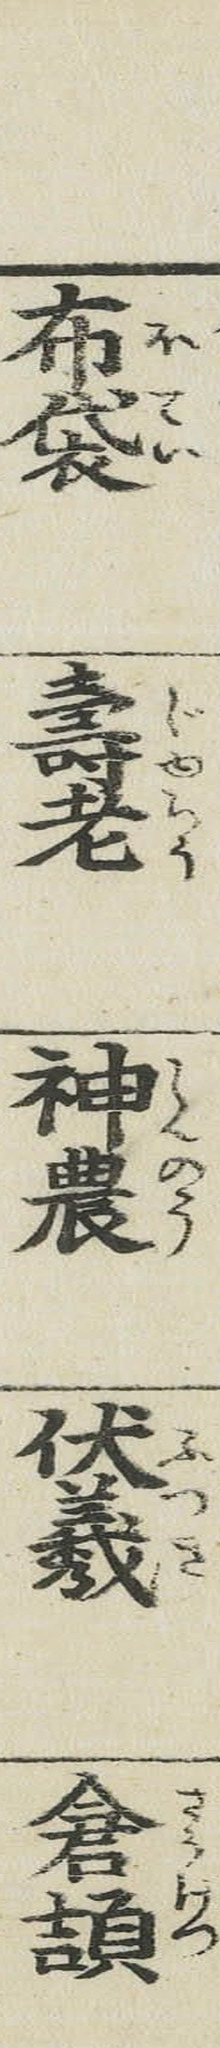布袋寿老神農伏羲倉頡
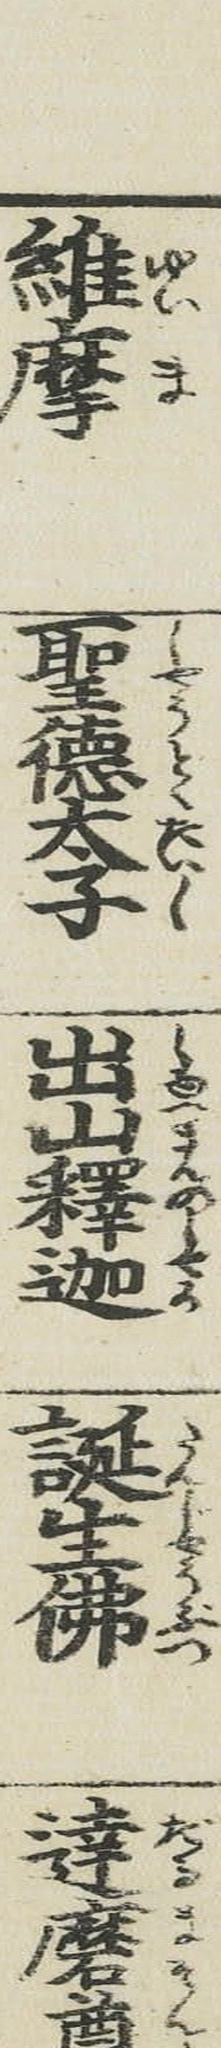維摩聖徳太子出山釈迦誕生仏達磨尊者

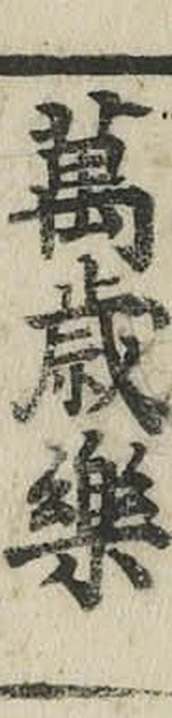万歳楽
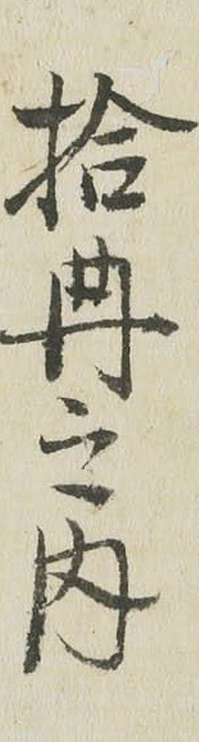拾冊之内
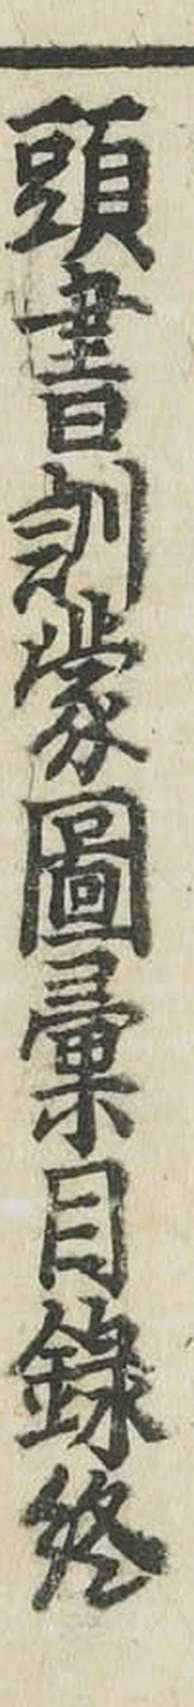頭書訓蒙図彙目録終
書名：増補頭書訓蒙図彙大成 10巻 1:序, 凡例, 目録
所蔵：東京学芸大学教育コンテンツアーカイブ
